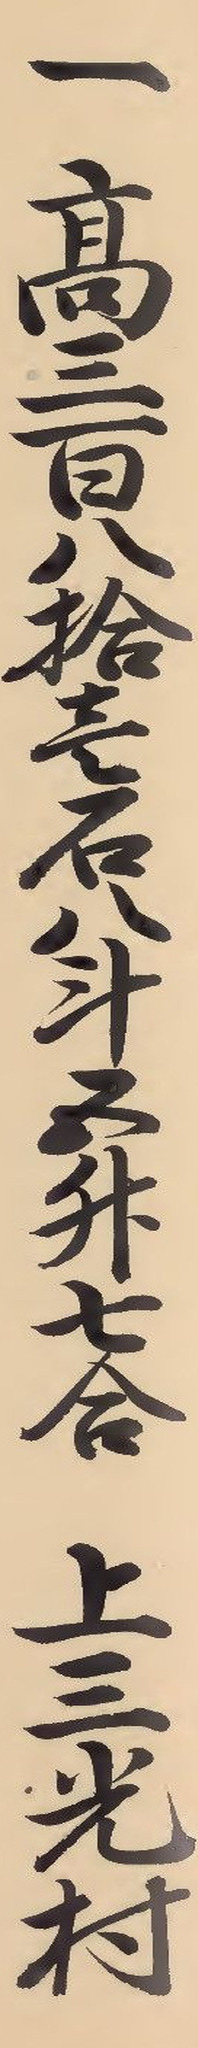一高三百八拾壱石八斗五升七合上三光村
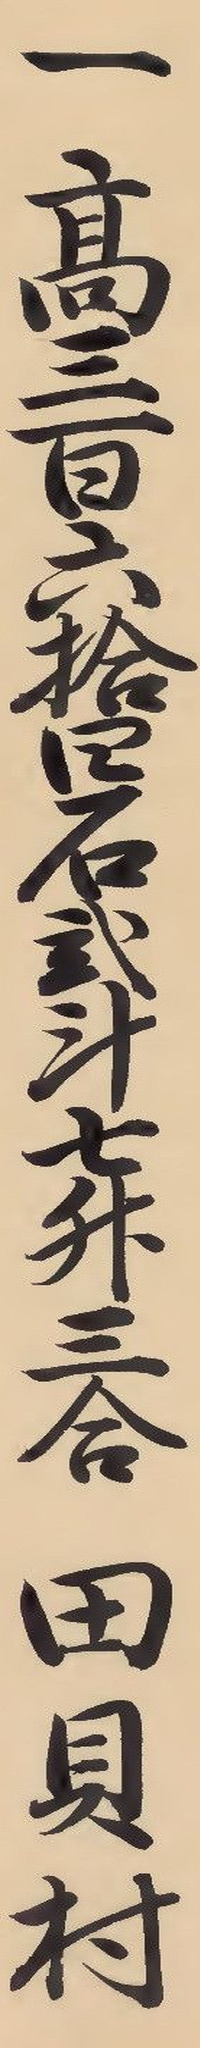一高三百六拾四石弐斗七升三合田貝村
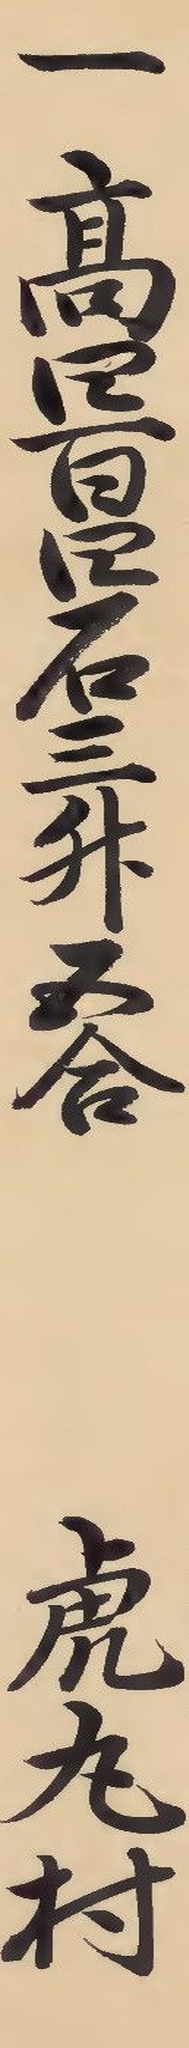一高四百四石三升五合虎丸村
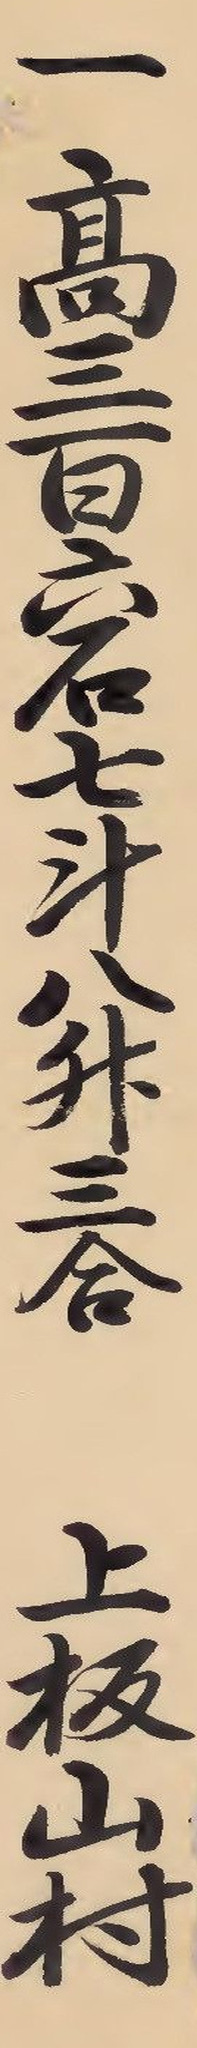一高三百六石七斗八升三合上板山村

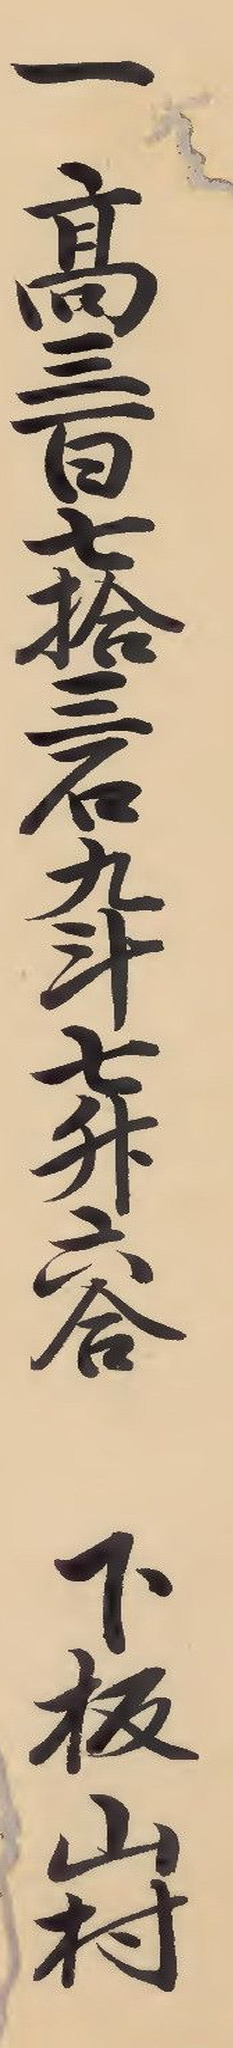一高三百七拾三石九斗七升六合下板山村
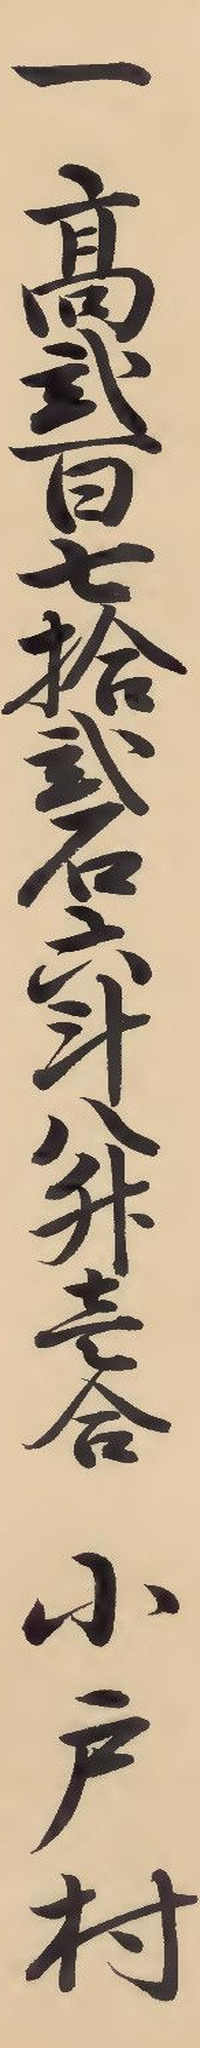一高弐百七拾弐石六斗八升壱合小戸村
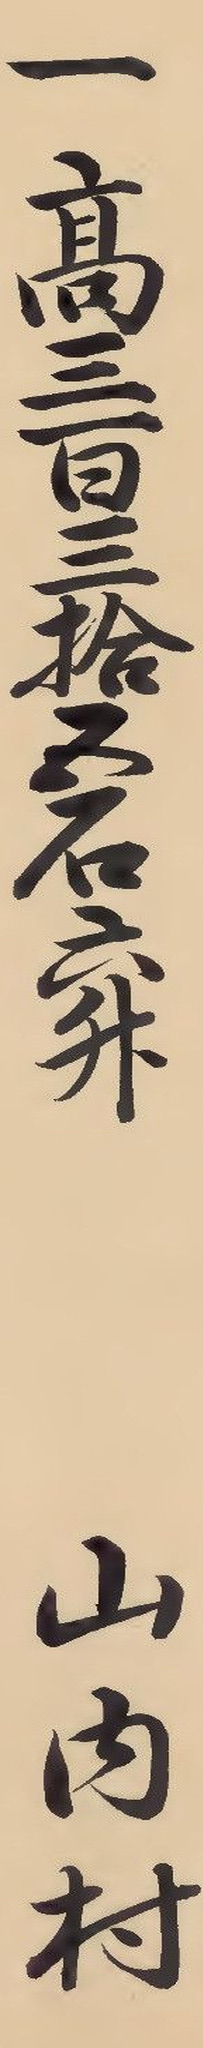一高三百三拾五石六升山内村
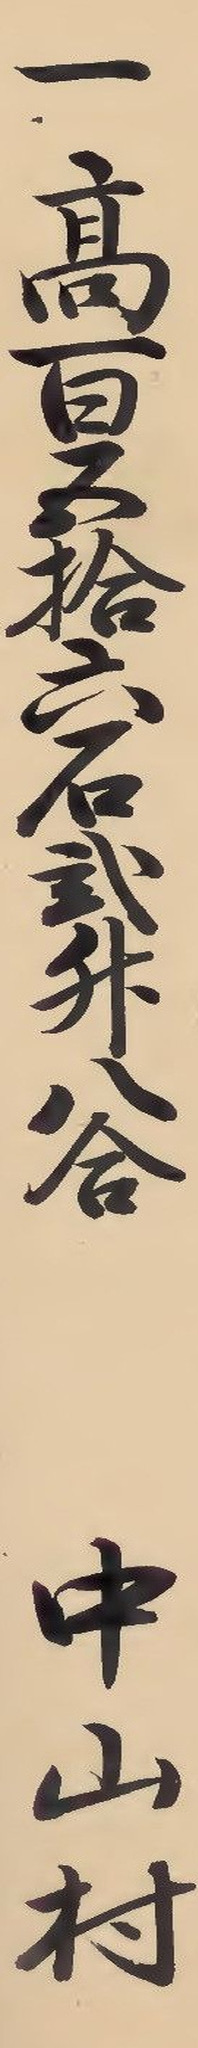一高百五拾六石弐升八合中山村
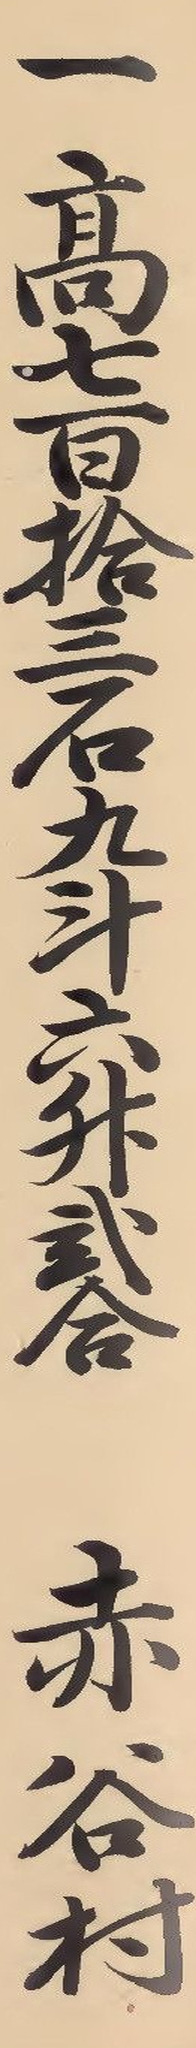一高七百拾三石九斗六升弐合赤谷村
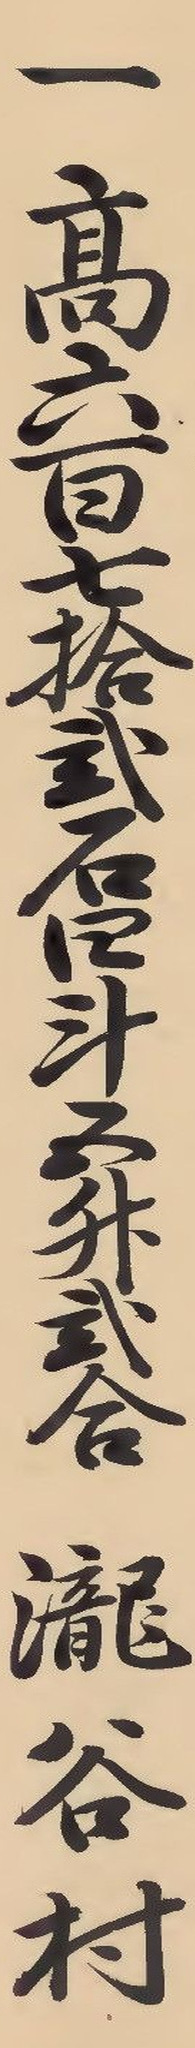一高六百七拾弐石四斗五升弐合滝谷村
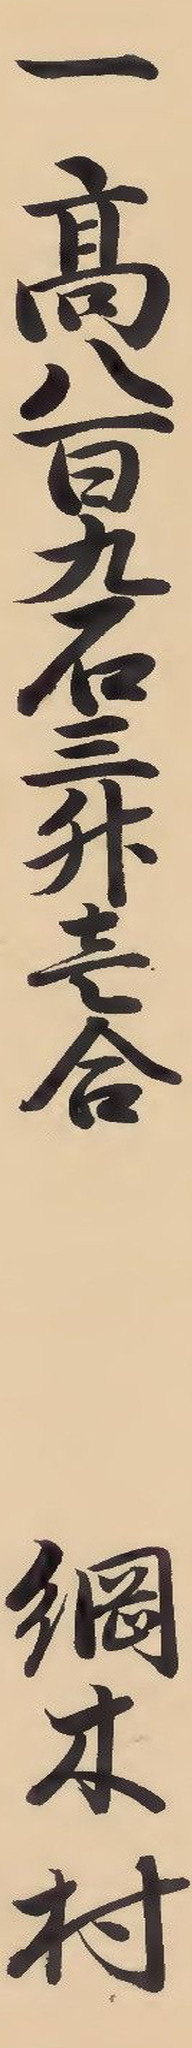一高八百九石三升壱合綱木村
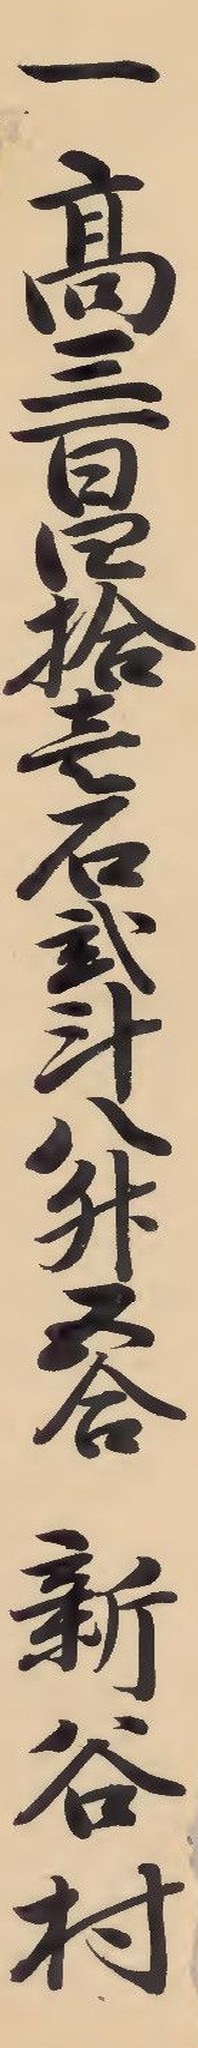一高三百四拾壱石弐斗八升五合新谷村

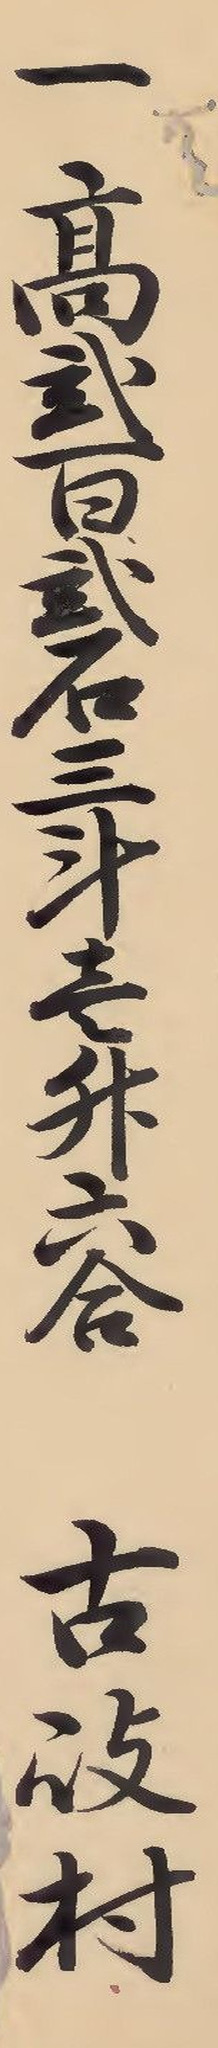一高弐百弐石三斗壱升六合古岐村
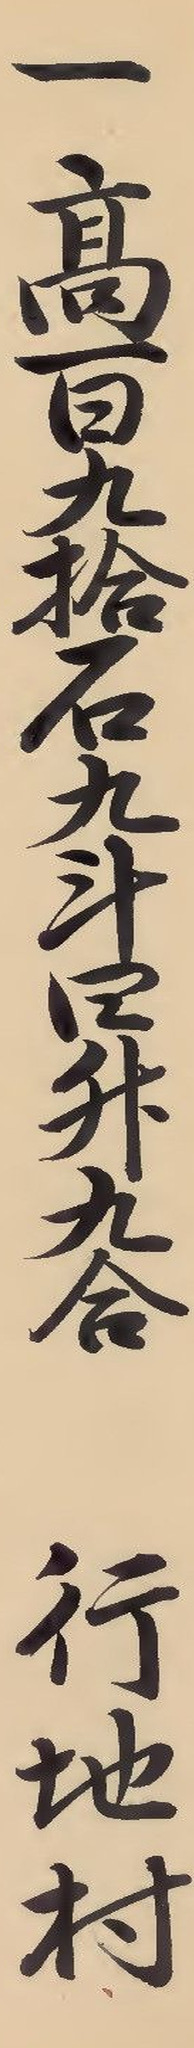一高百九拾石九斗四升九合行地村
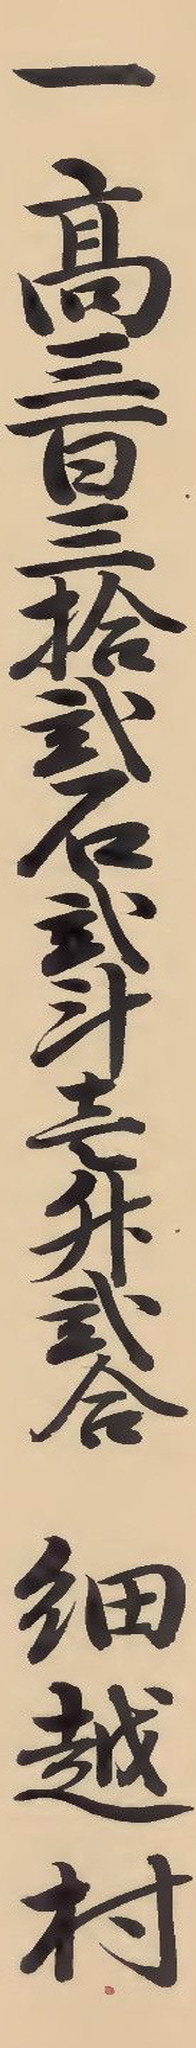一高三百三拾弐石弐斗壱升弐合細越村
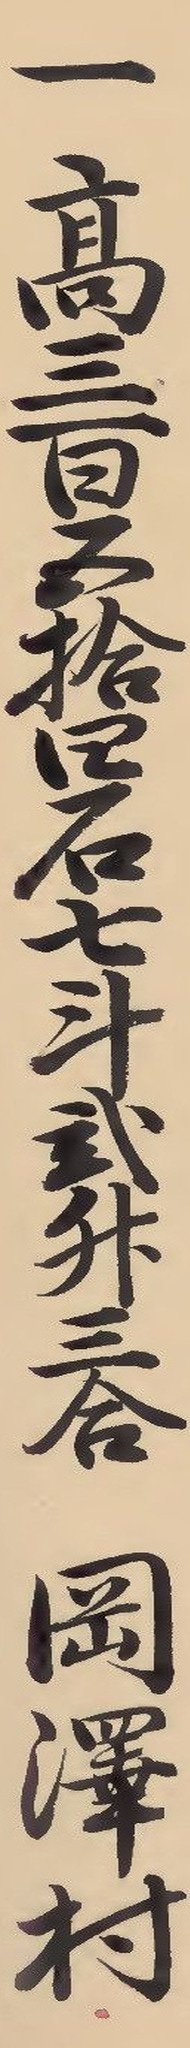一高三百五拾四石七斗弐升三合岡沢村
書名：越後国郷帳　下
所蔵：国立公文書館 National Archives of Japan
